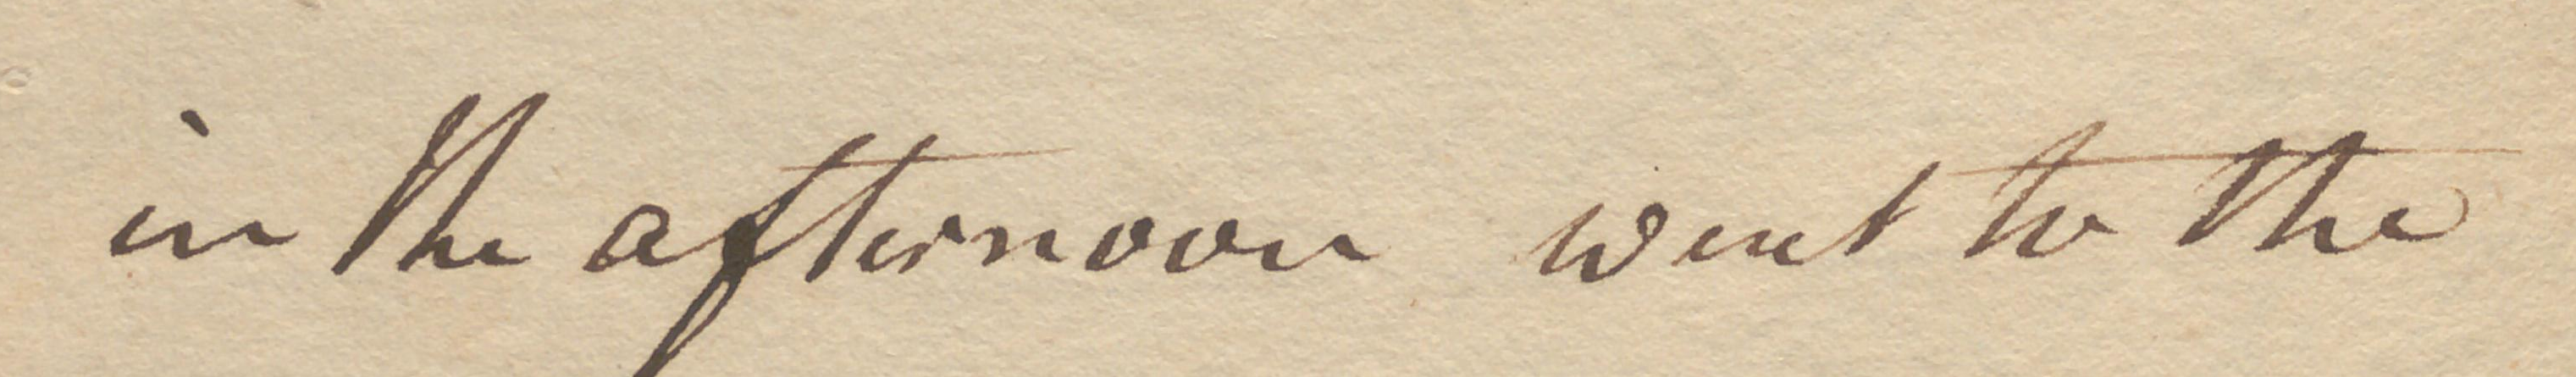in the afternoon went to the
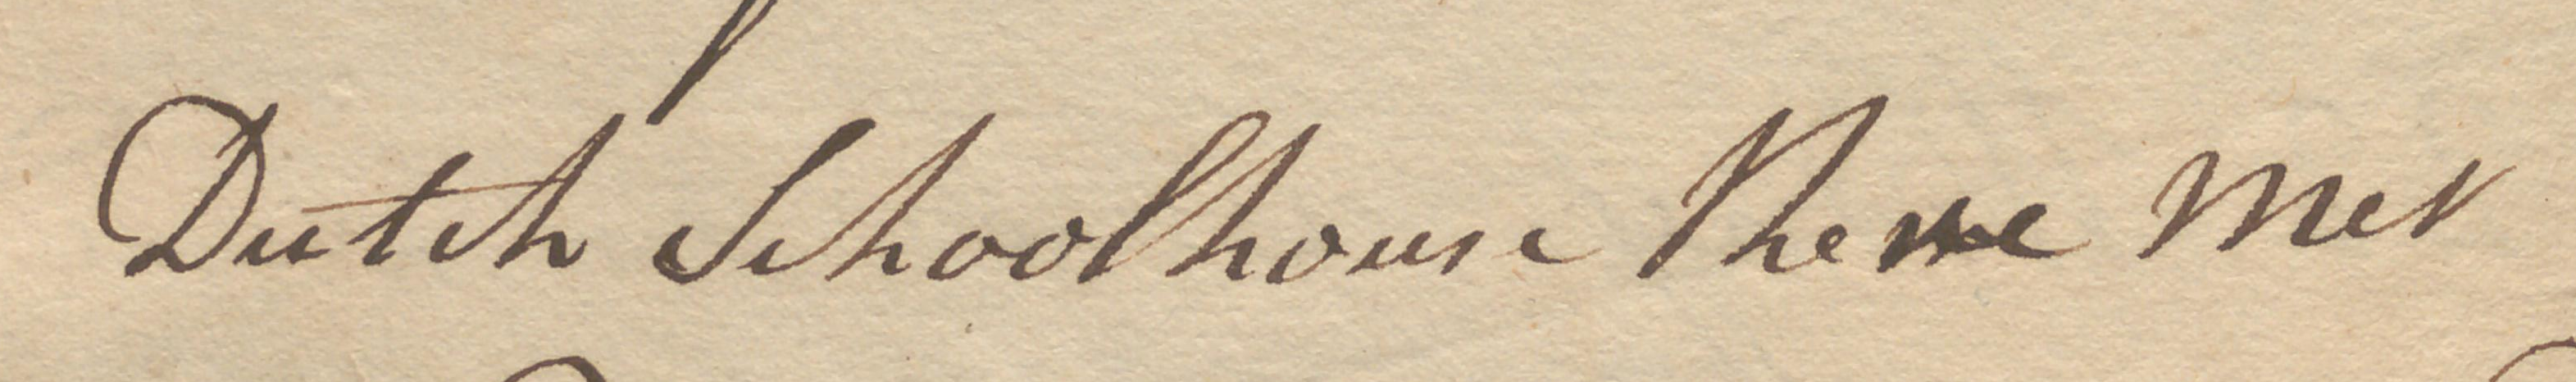Dutch Schoolhouse there met
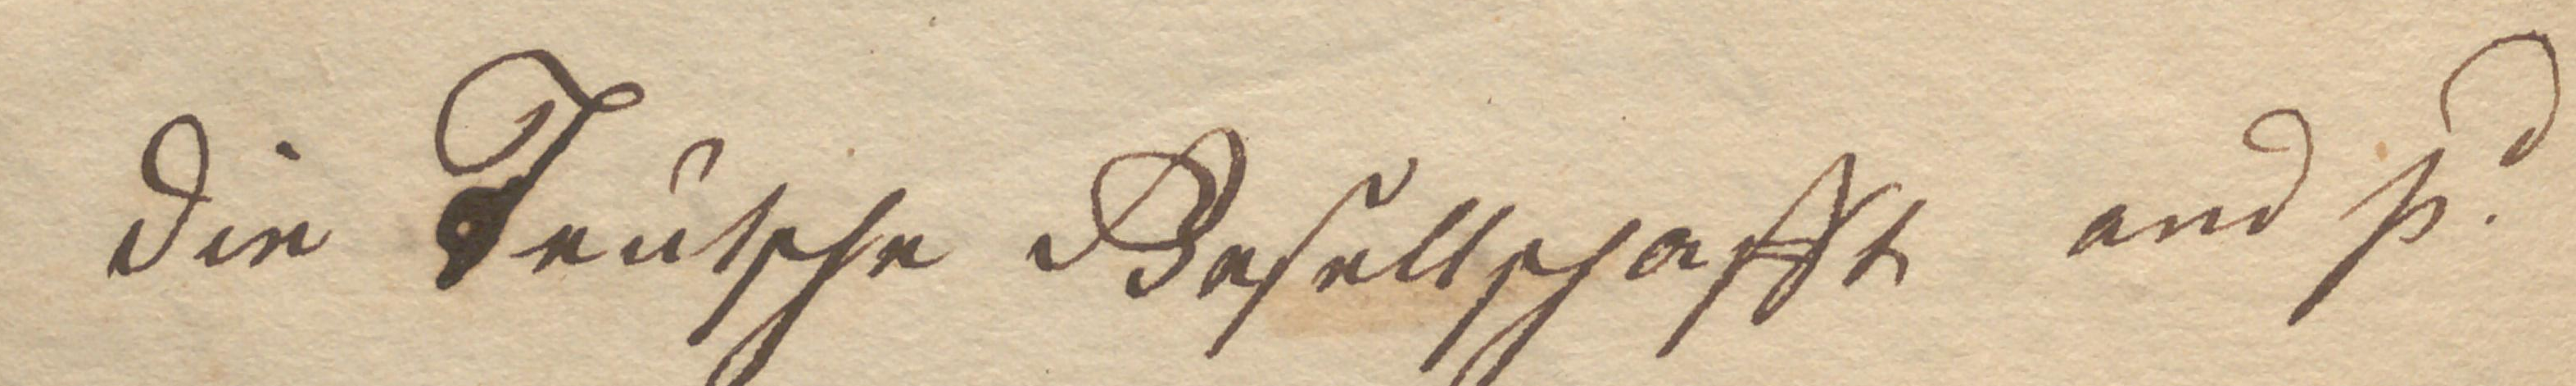din Teupfe Basellpfafft and p^d.
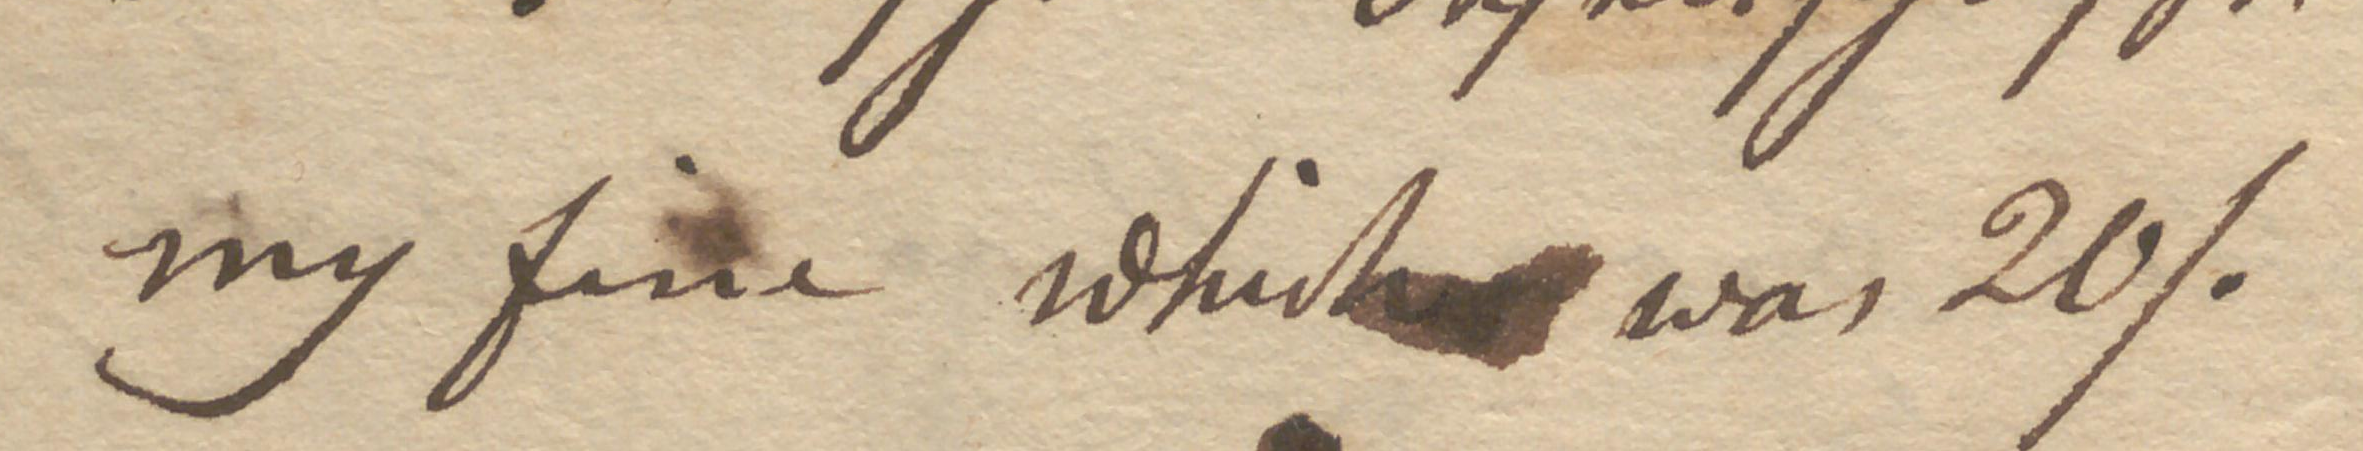my fine which was 20s.
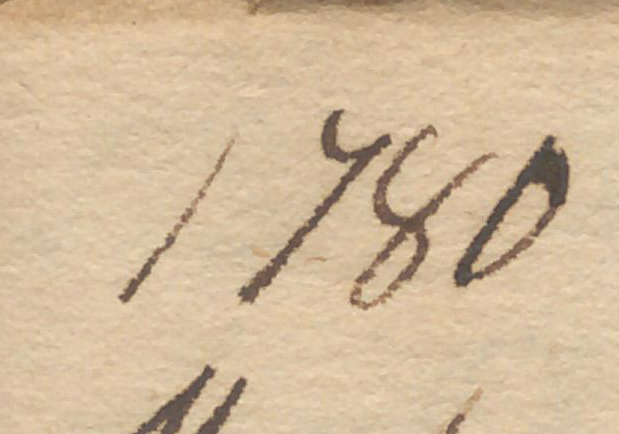1780
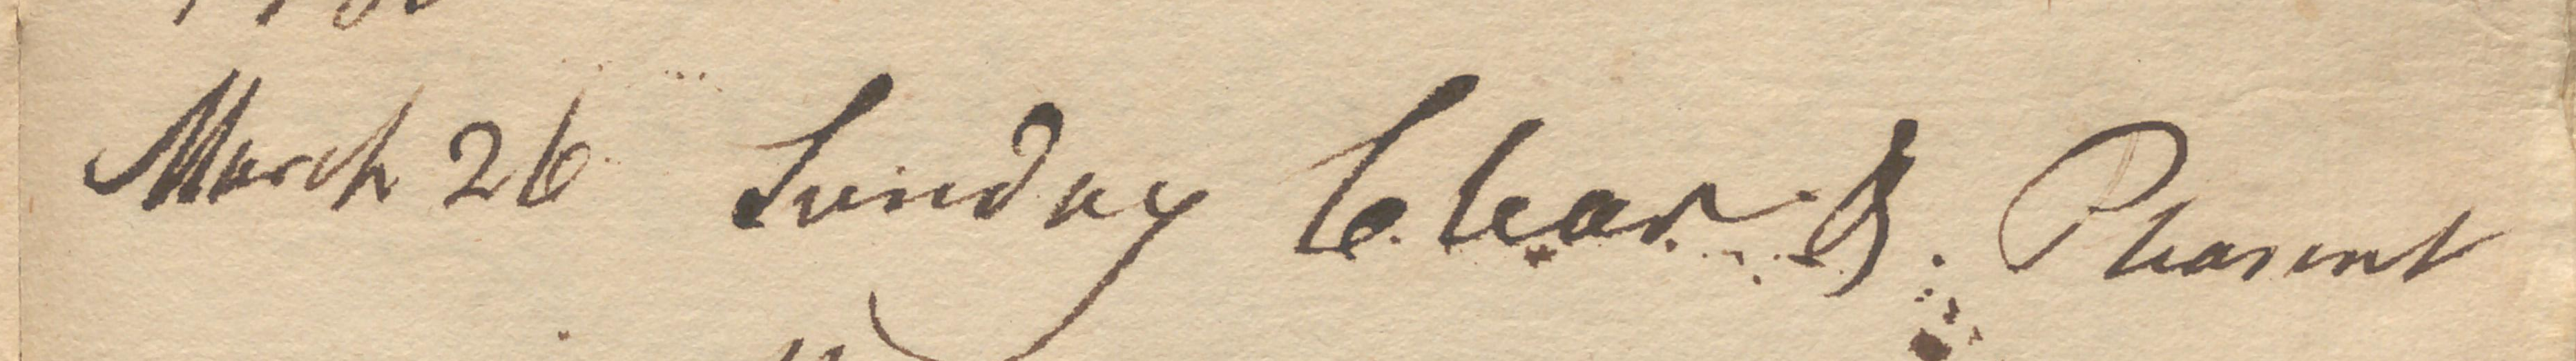March 26. Sunday Clear & Pleasent
